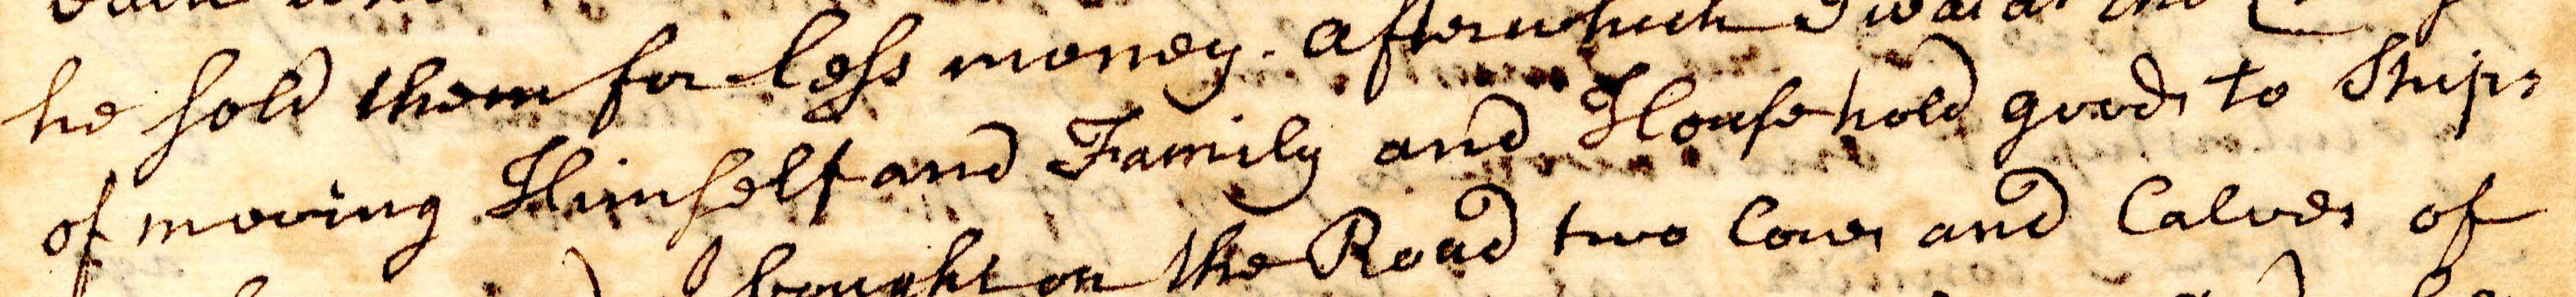of moving Himself and Family and Household goods to Ship-
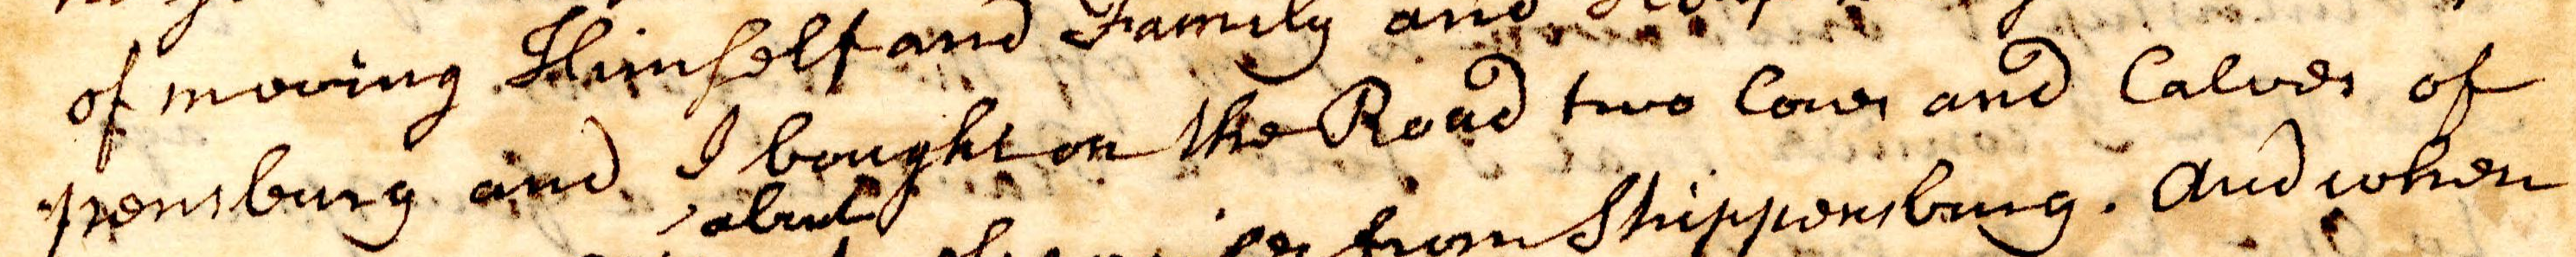pensburg and I bought on the Road two Cows and Calves of
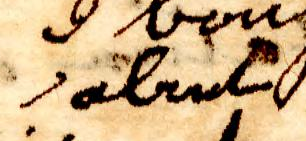about
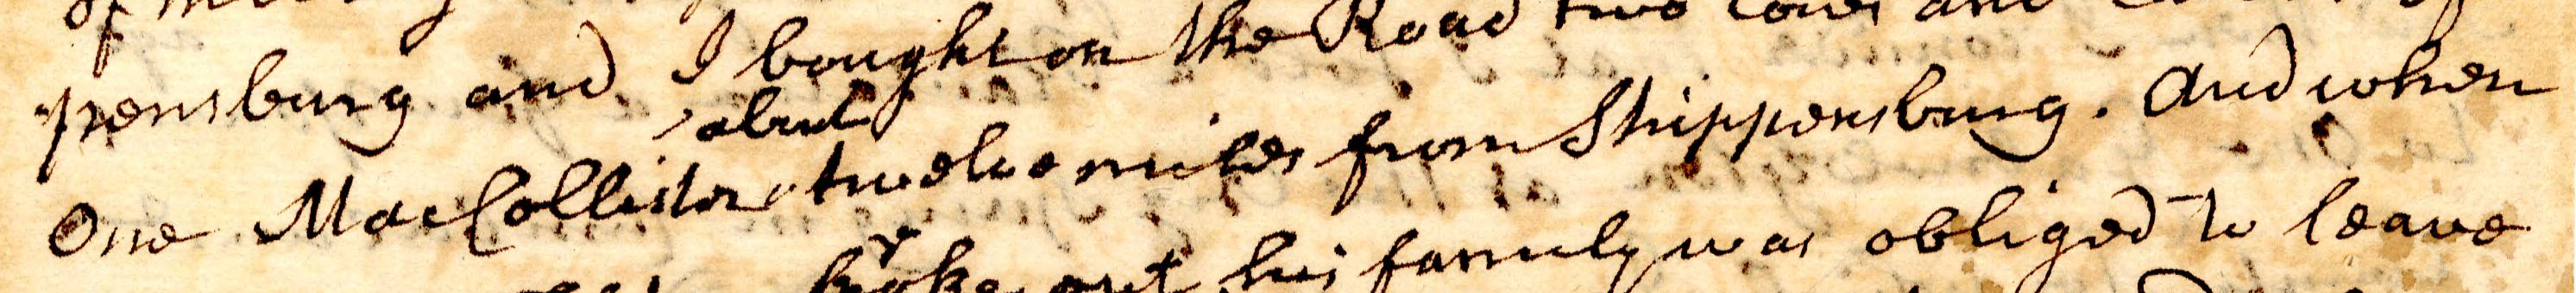one MacCollister twelve miles from Shippensburg. And when
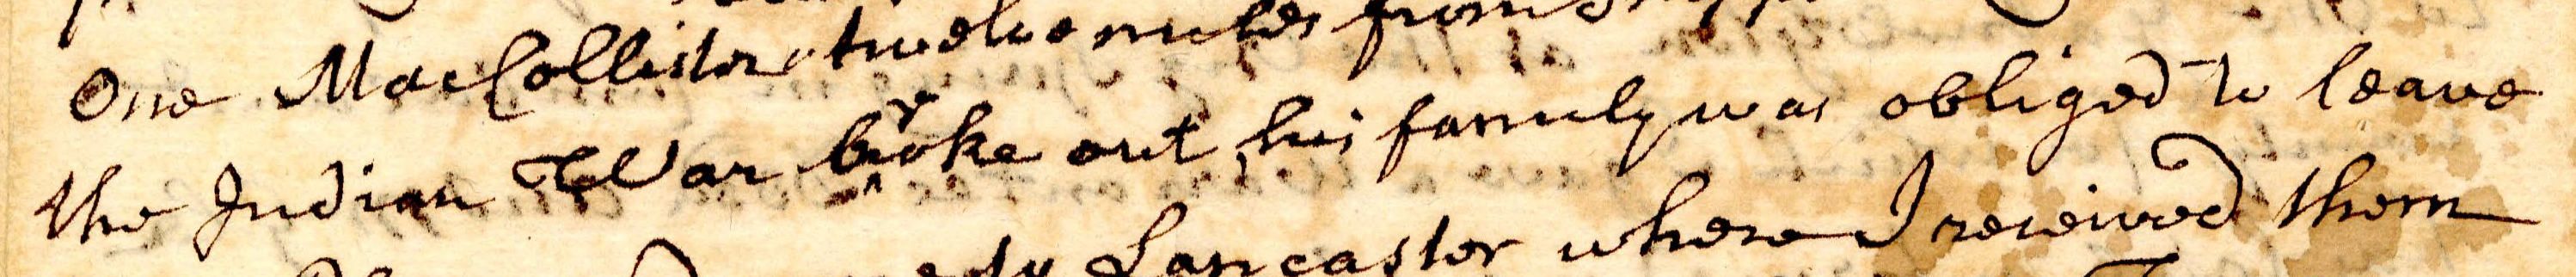the Indian War broke out, his family was obliged to leave
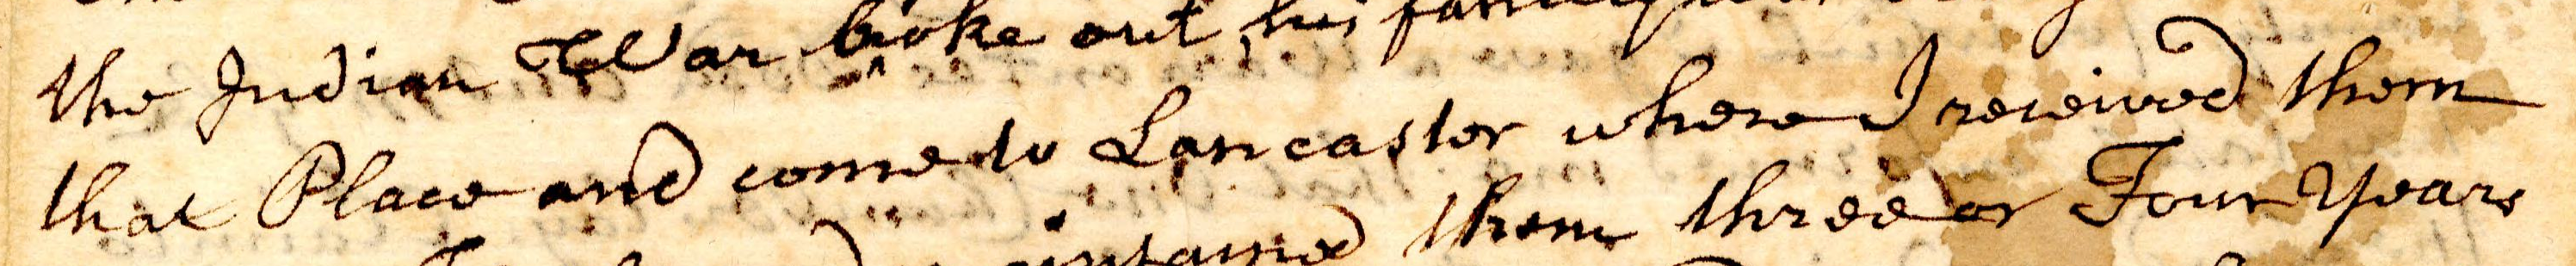that Place and come to Lancaster where I received them
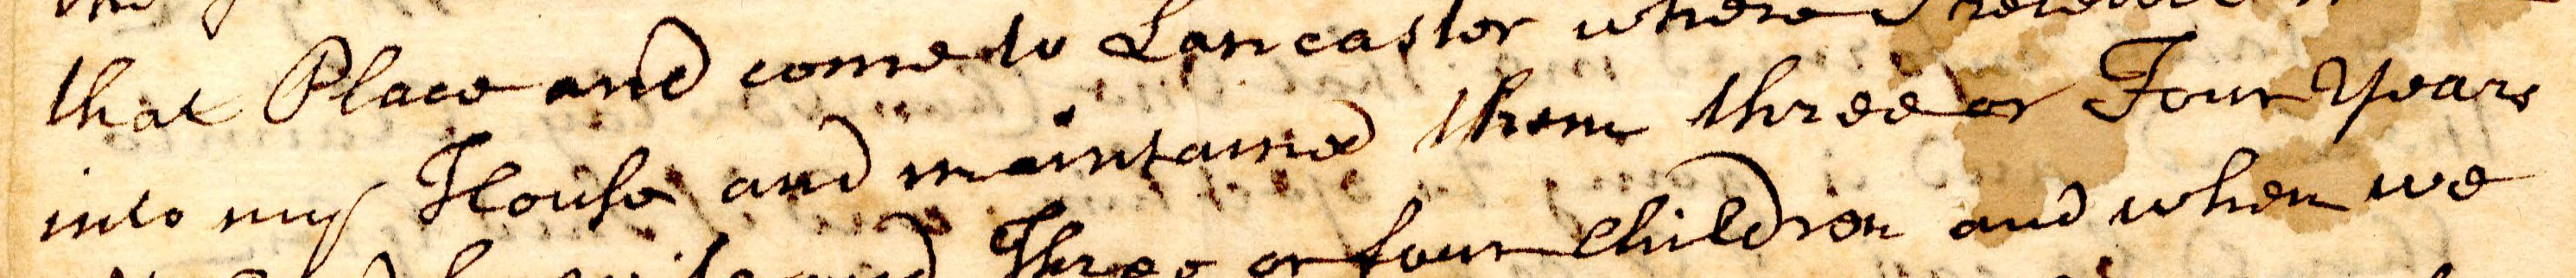into my House and maintained them three or Four Years
